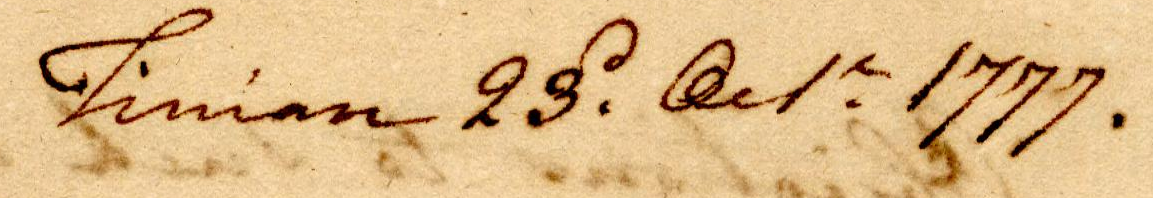Tinian 23^d. Oct^r. 1777.
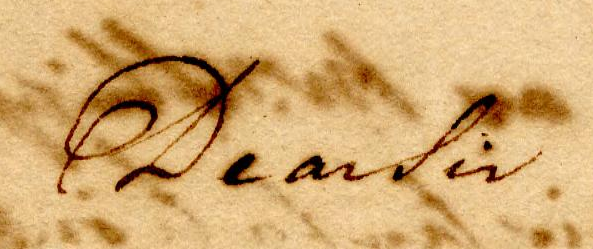Dear Sir
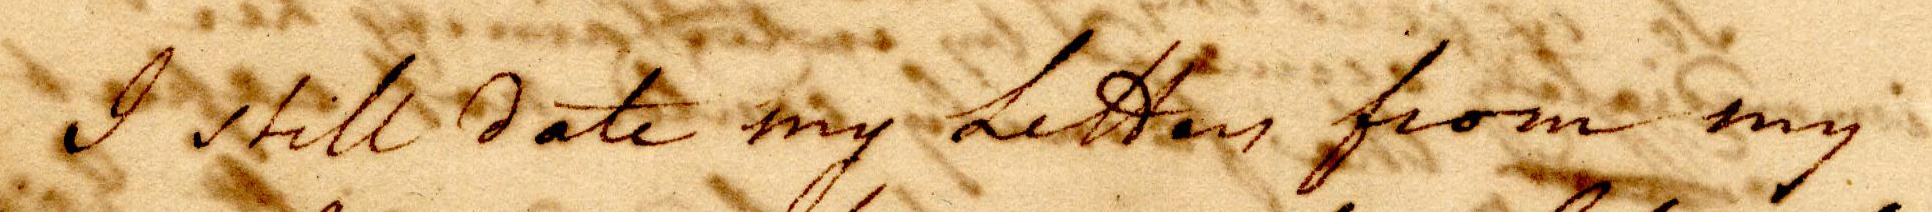I still date my Letters from my
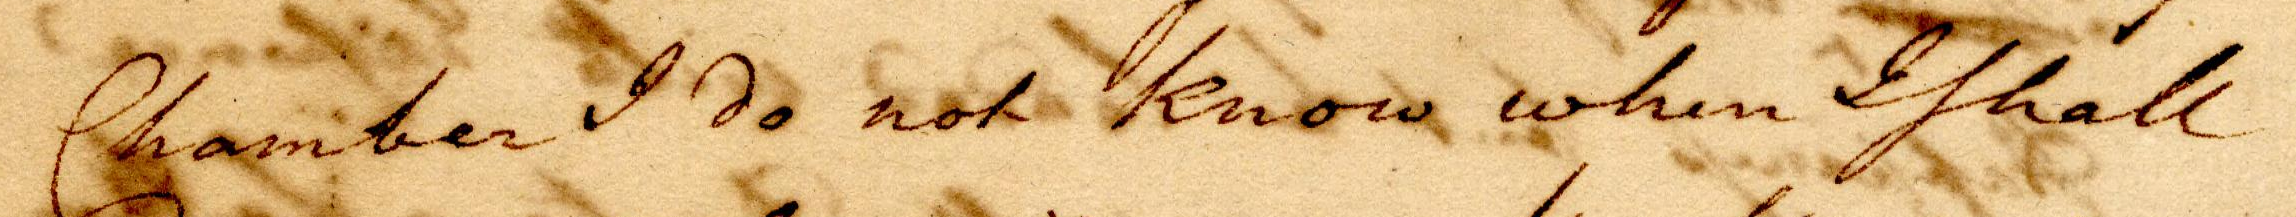Chamber I do not know when I shall
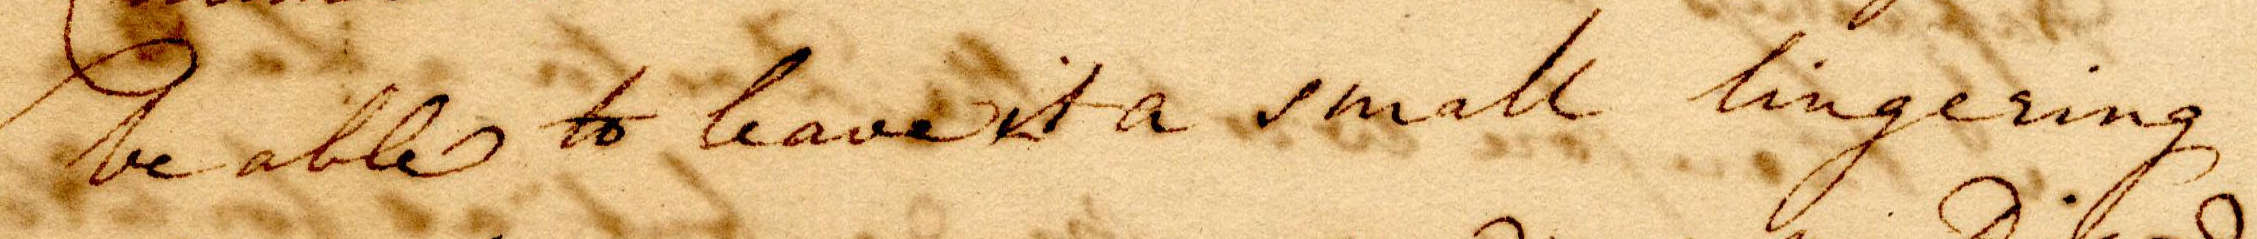be able to leave it a small lingering
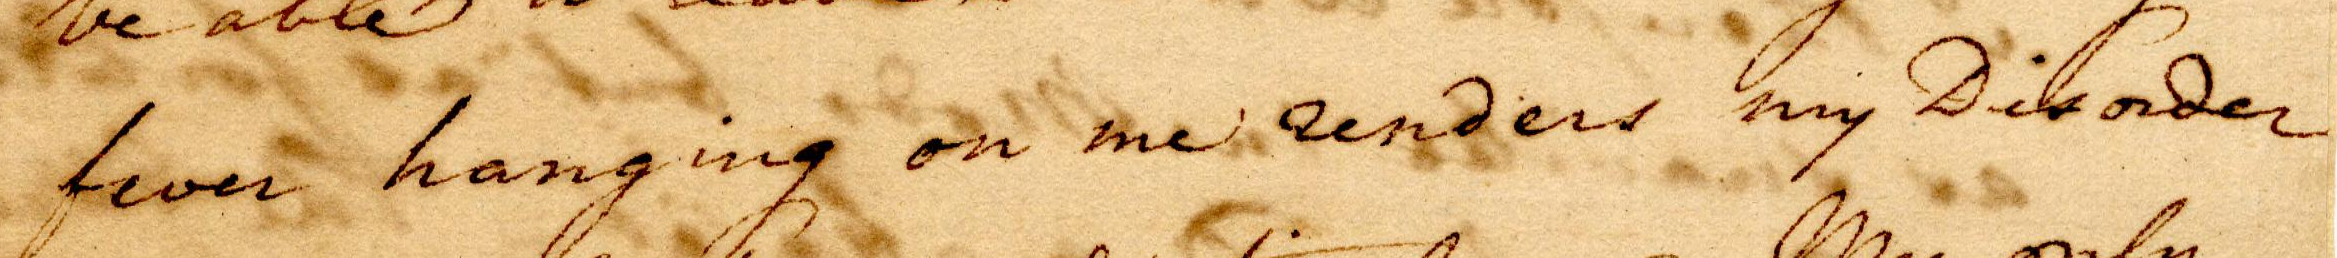fever hanging on me renders my Disorder
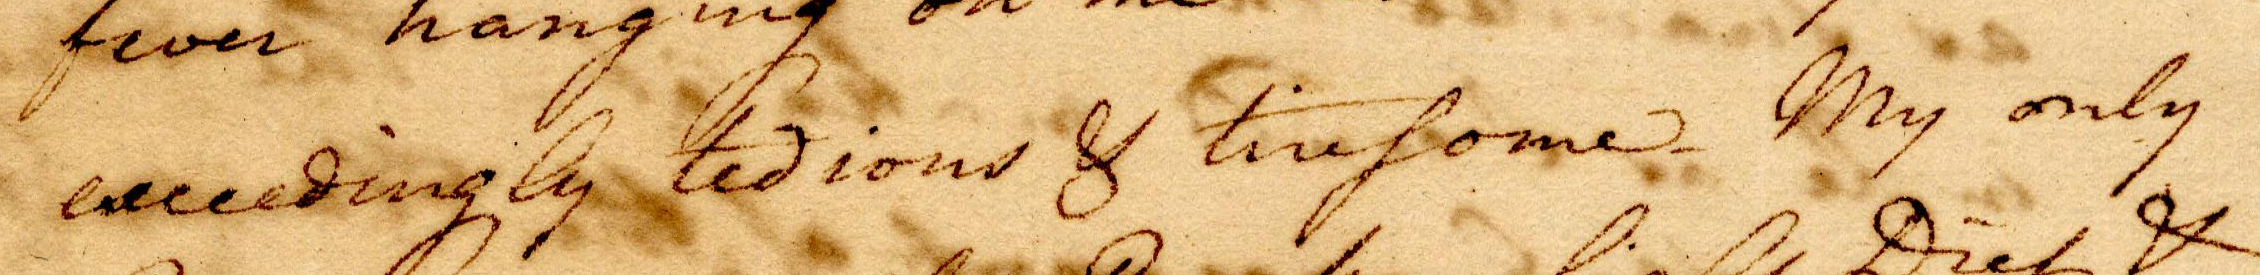exceedingly tedious & tiresome. My only
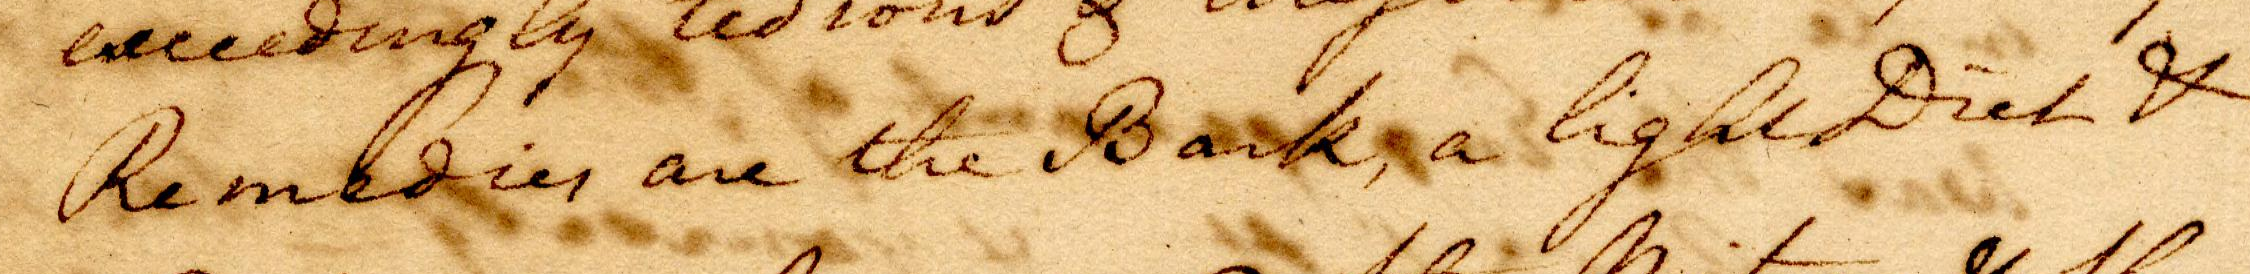Remedies are the Bark, a light Diet &
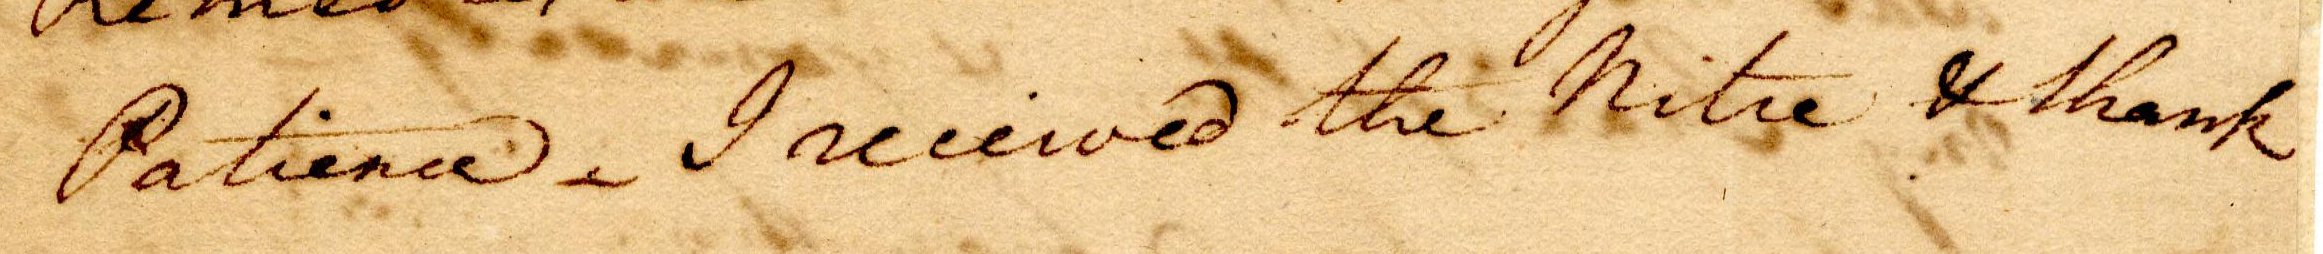Patience. I received the Nitre & thank
